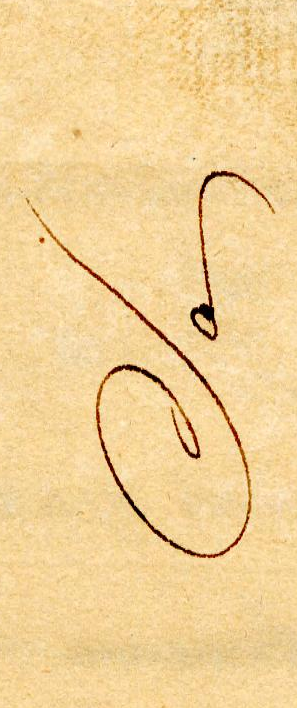To
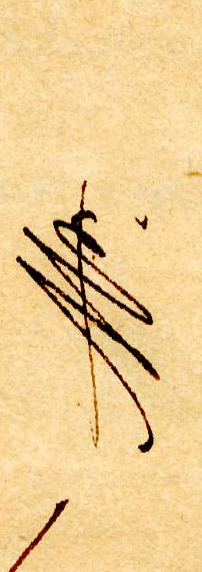M^r.
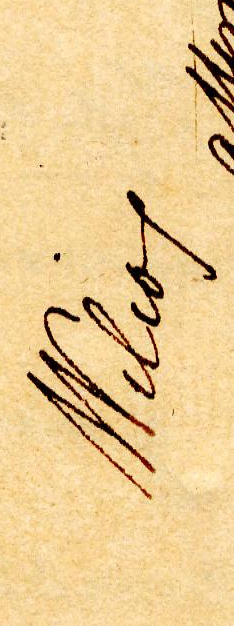Wilson
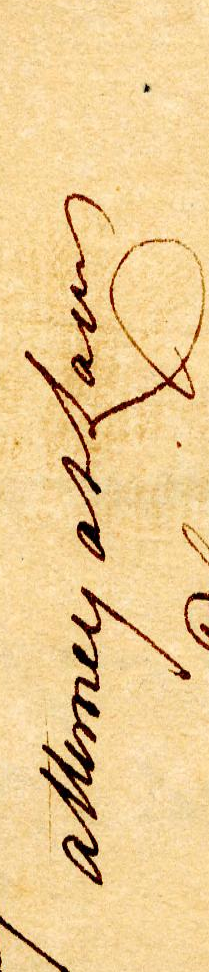attorney at Law
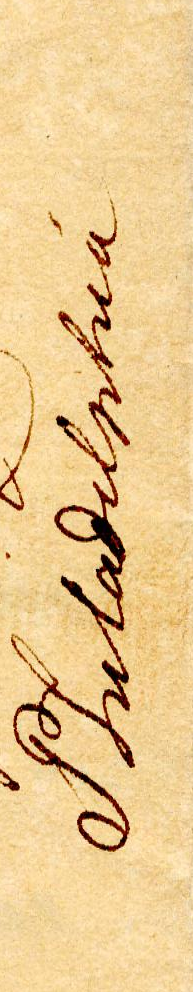Philadelphia
